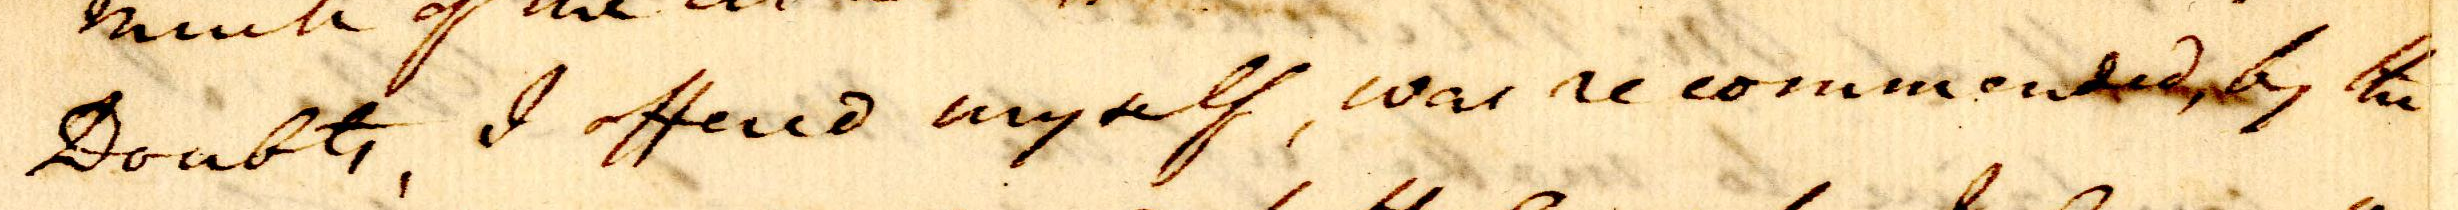Doubts, I offered myself, was recommended, by the
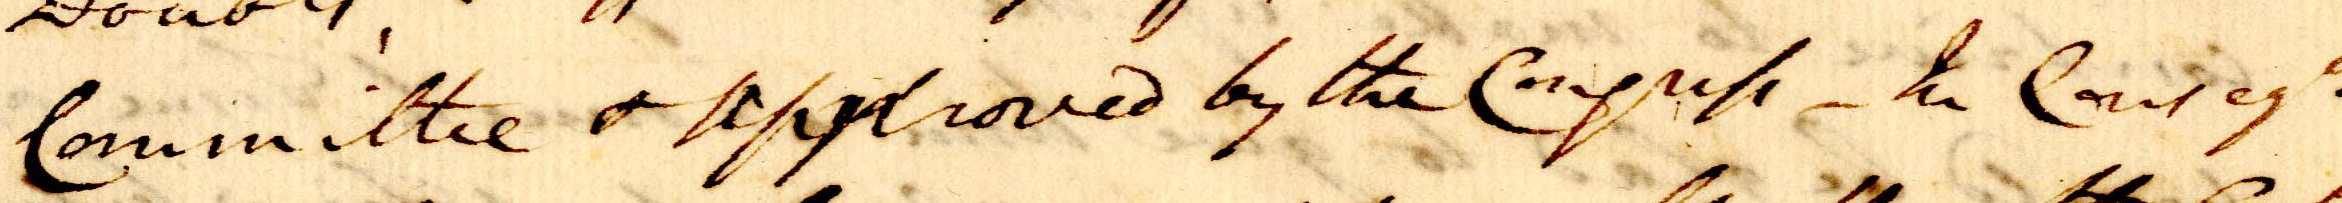Committee & approved by the Congress, he Causeg^a
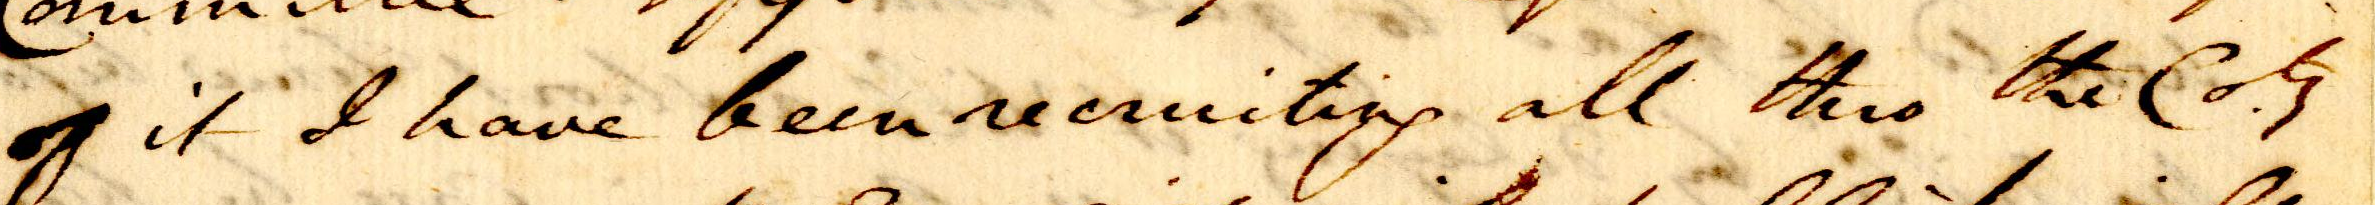of it I have been recruiting all thro' the Co^ty
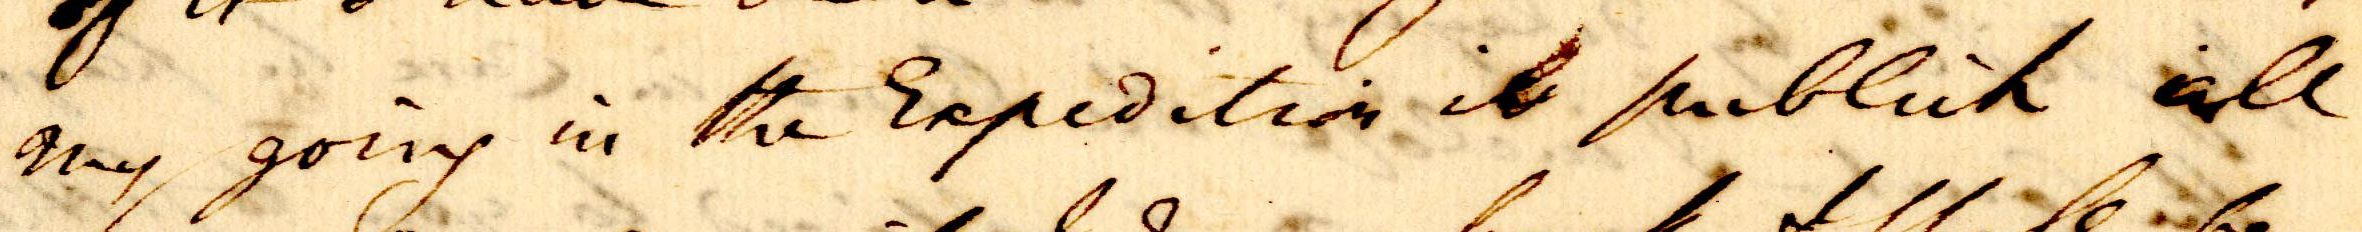my going in the Expedition is publick all
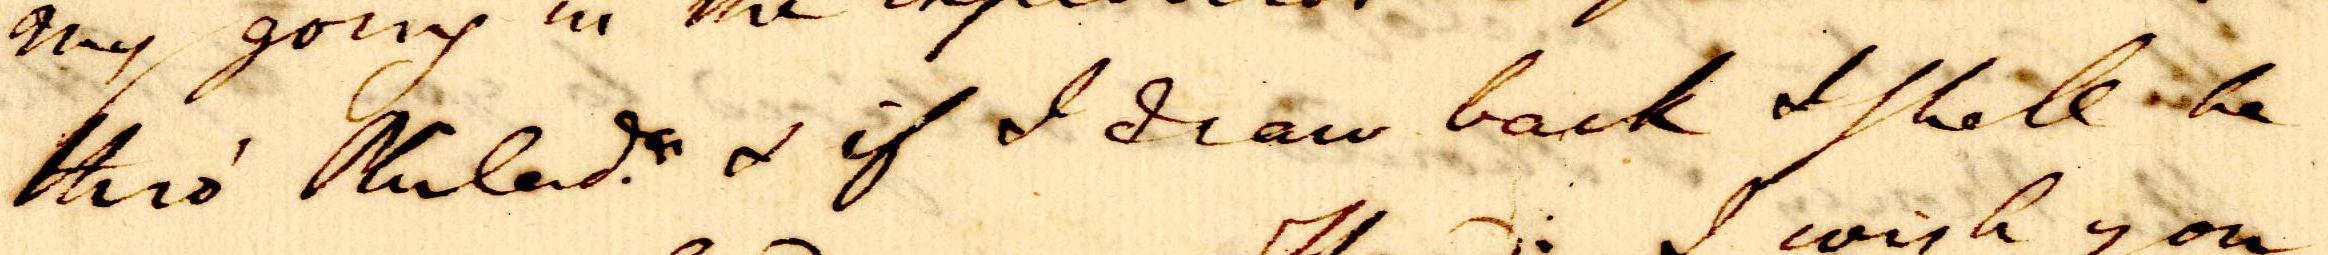tho' Philad^a & if I draw back I shall be
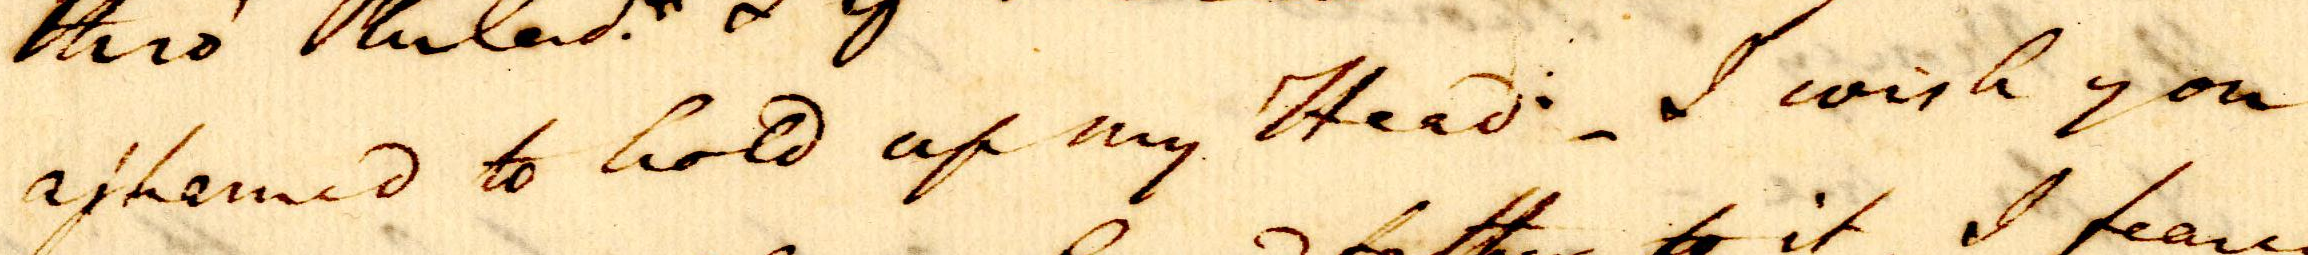ashamed to hold up my Head. I wish you
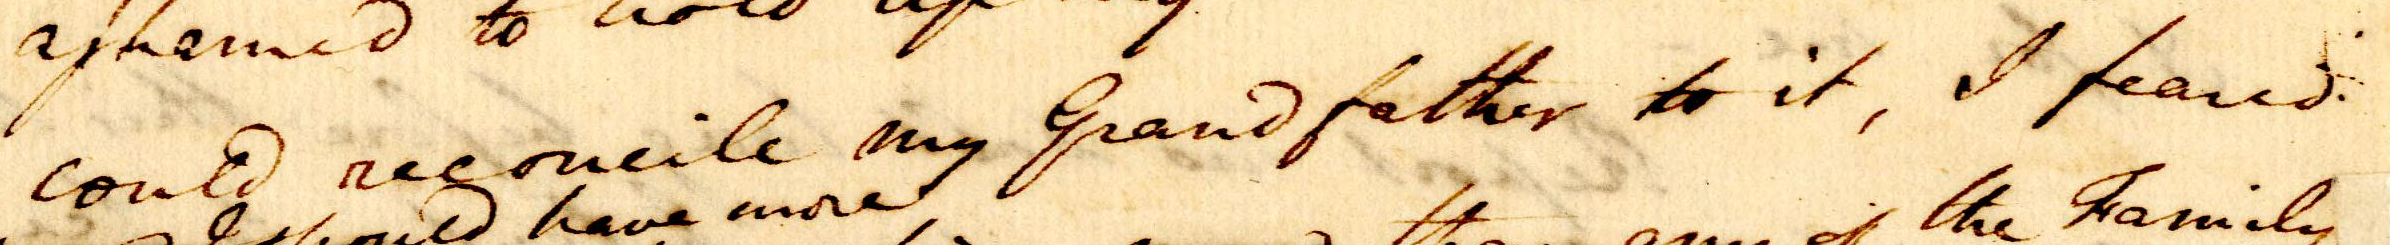could reconcile my Grandfather to it, I feared
